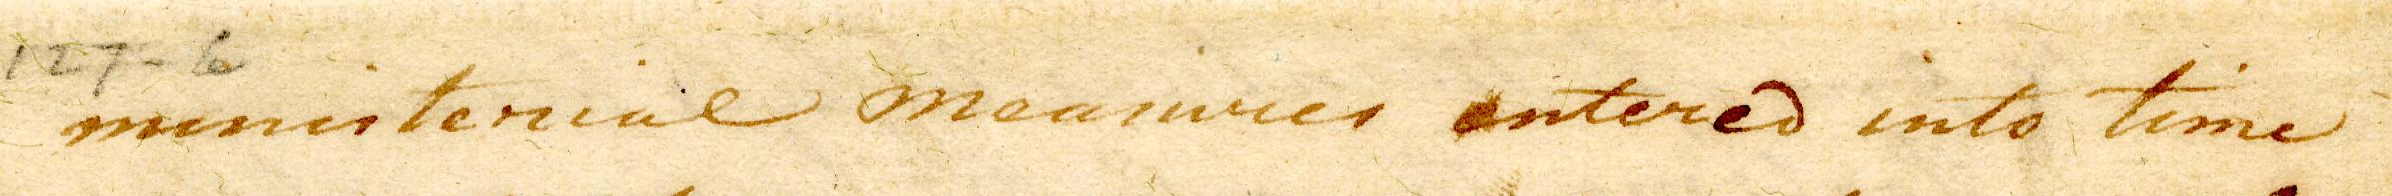ministerial measures entered into time
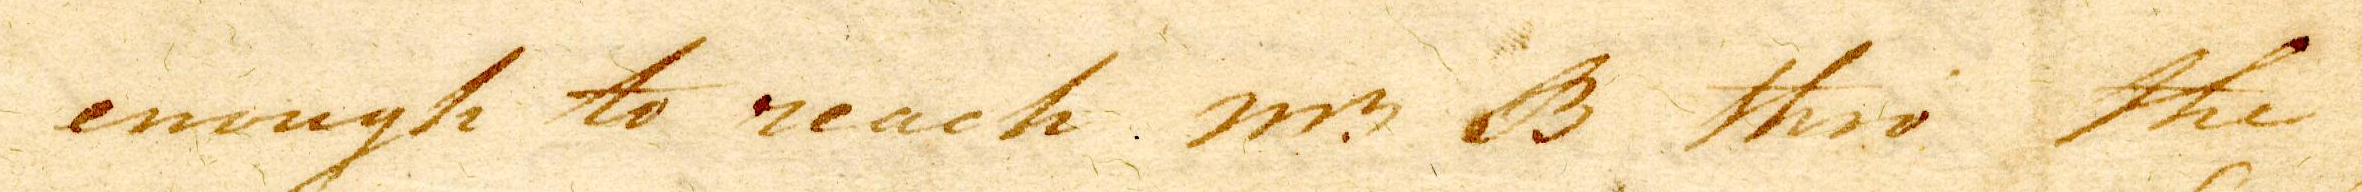enough to reach. M^r. B thro' the
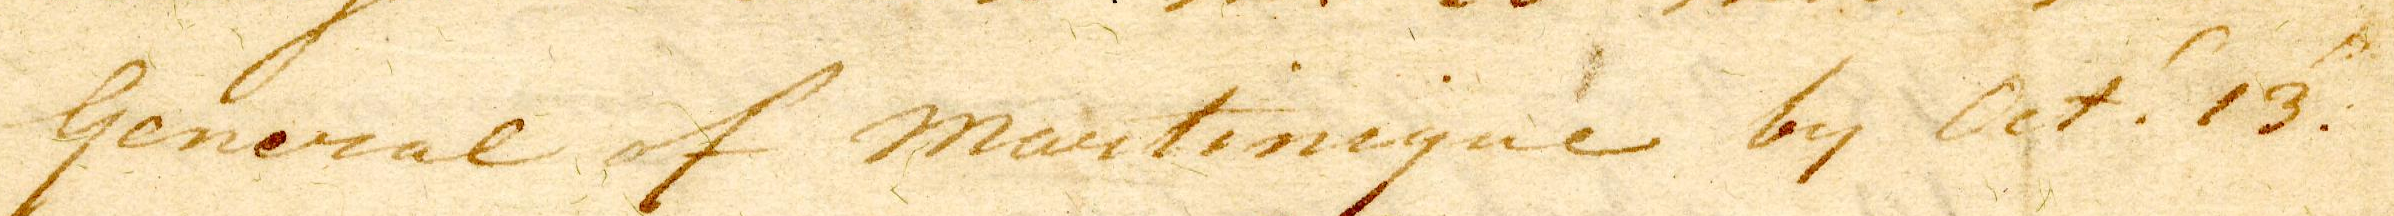General of Martinique by Oct. 13^th.
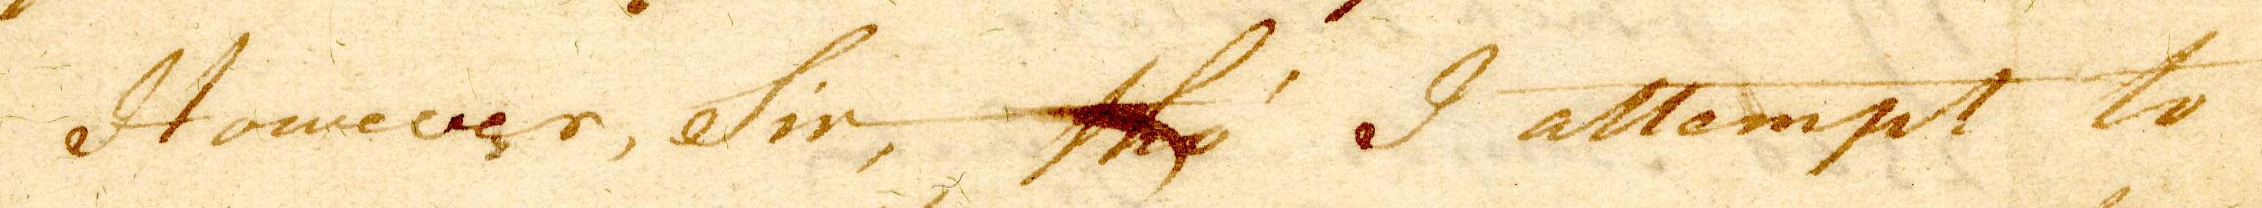However, Sir, tho' I attempt to
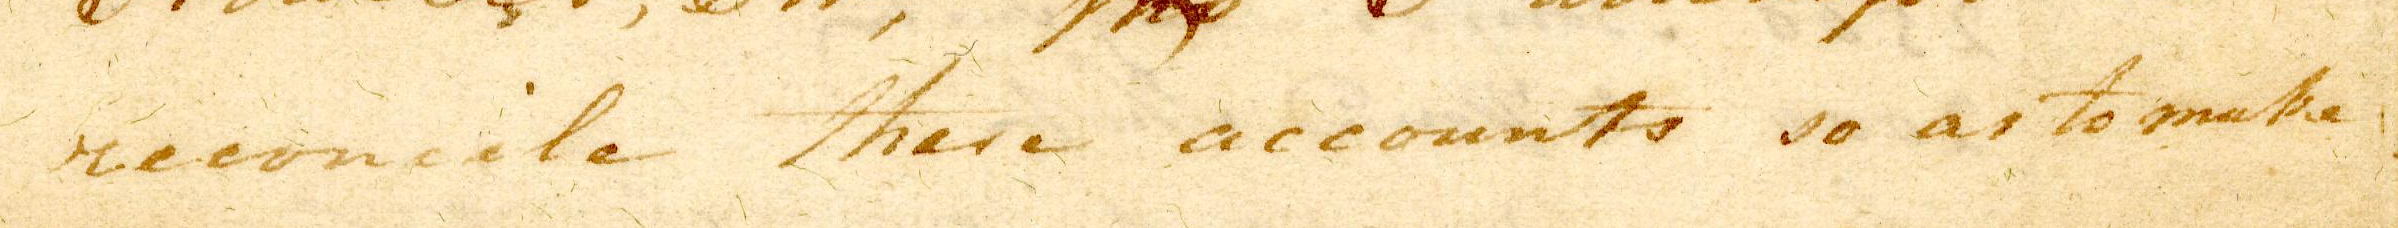reconcile these accounts so as to make
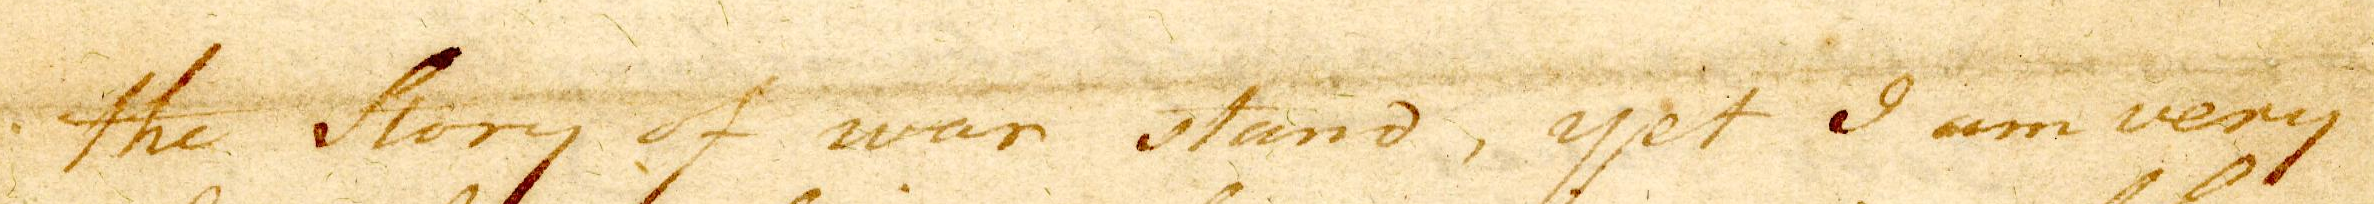the Story of war stand, yet I am very
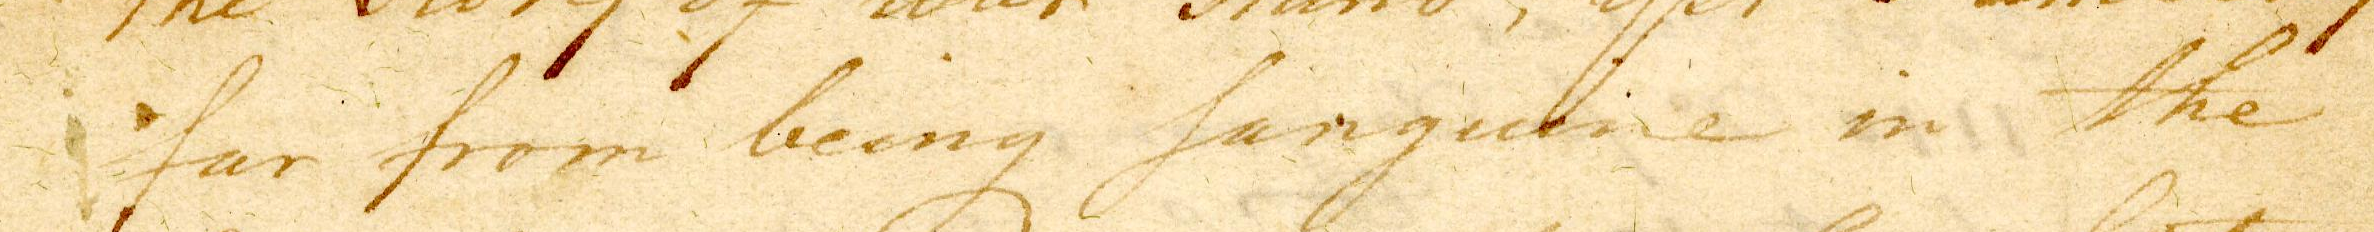far from being sanguine in the
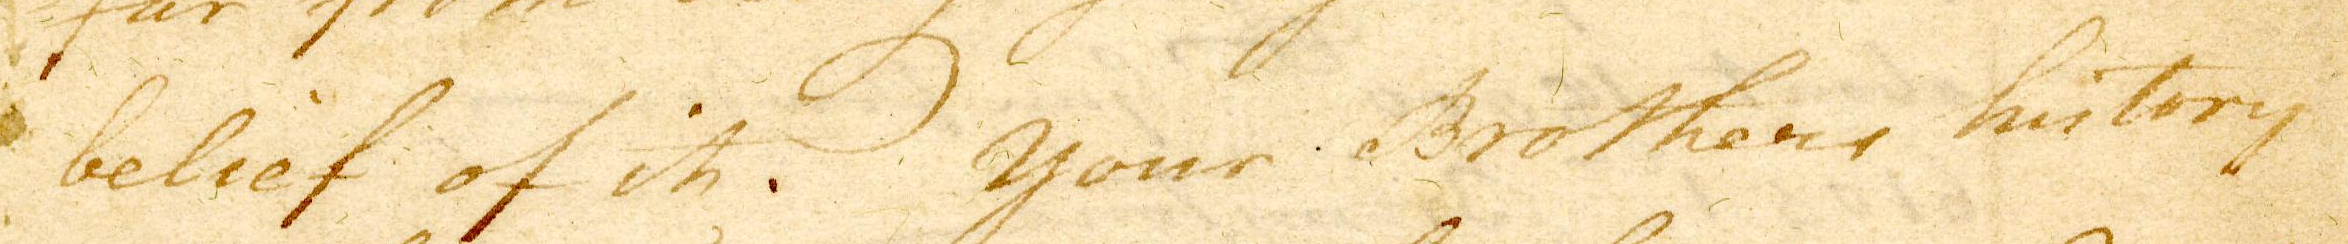belief of it. Your Brothers history
